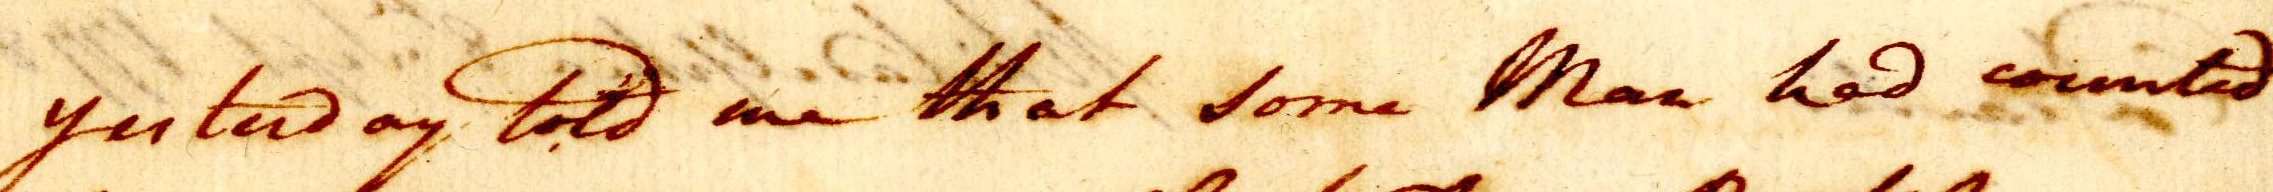yesterday told me that some Man had counted
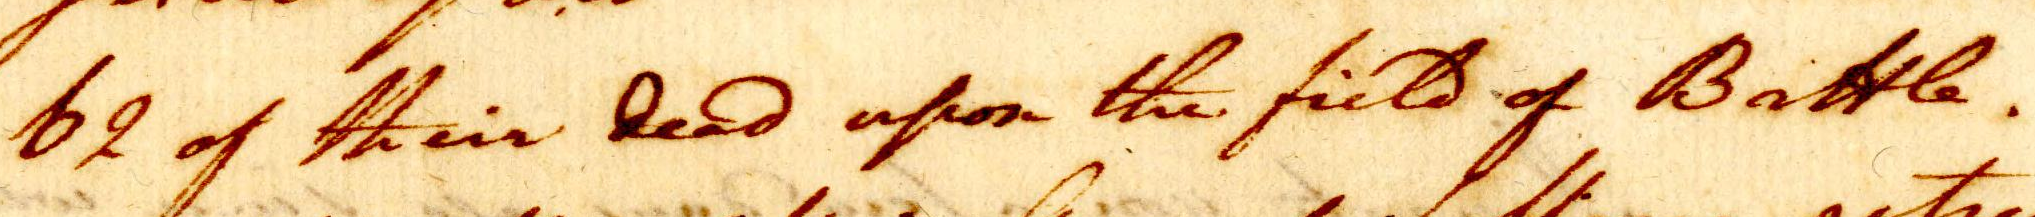62 of their dead upon the field of Battle.
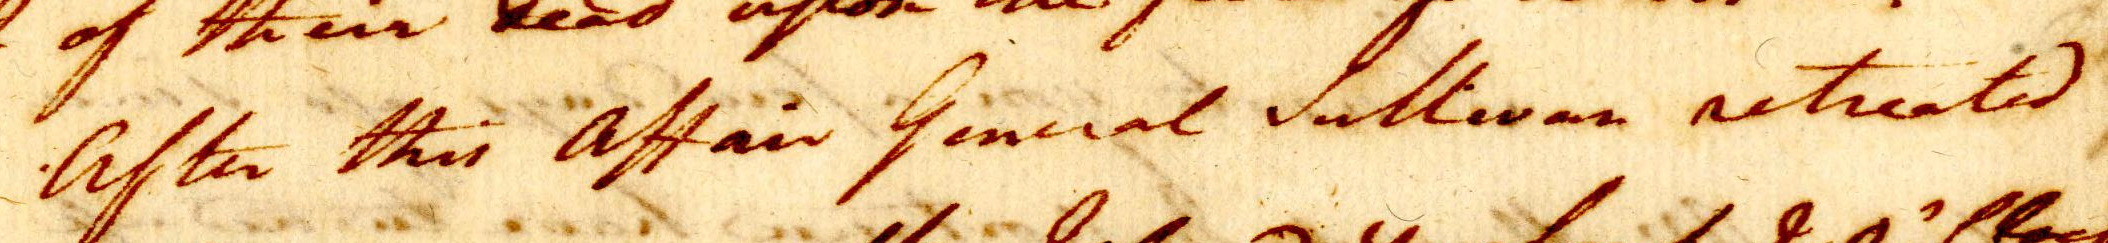After this Affair General Sullivan retreated
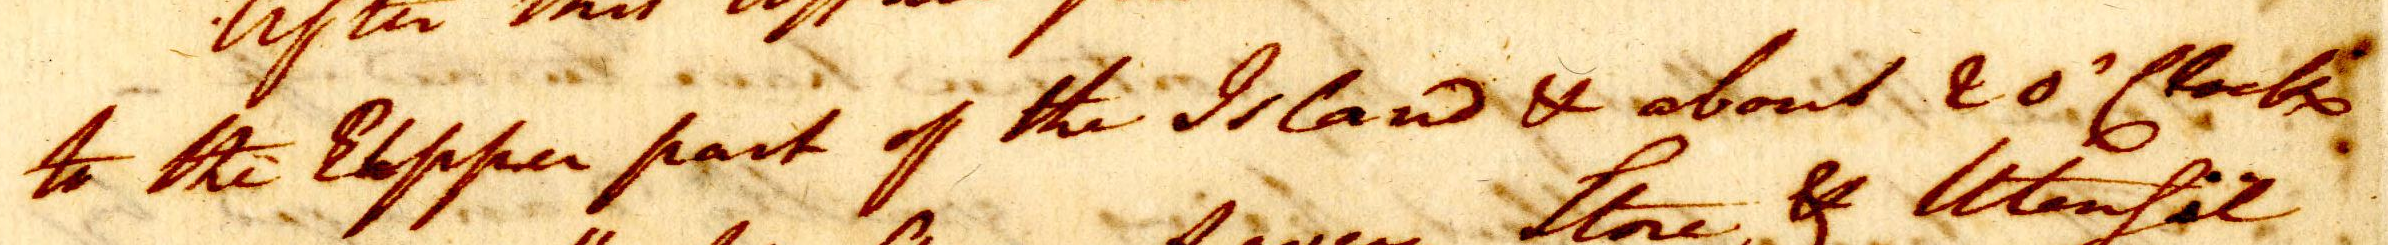to the Elppen part of the Island & about 2 0'Clock
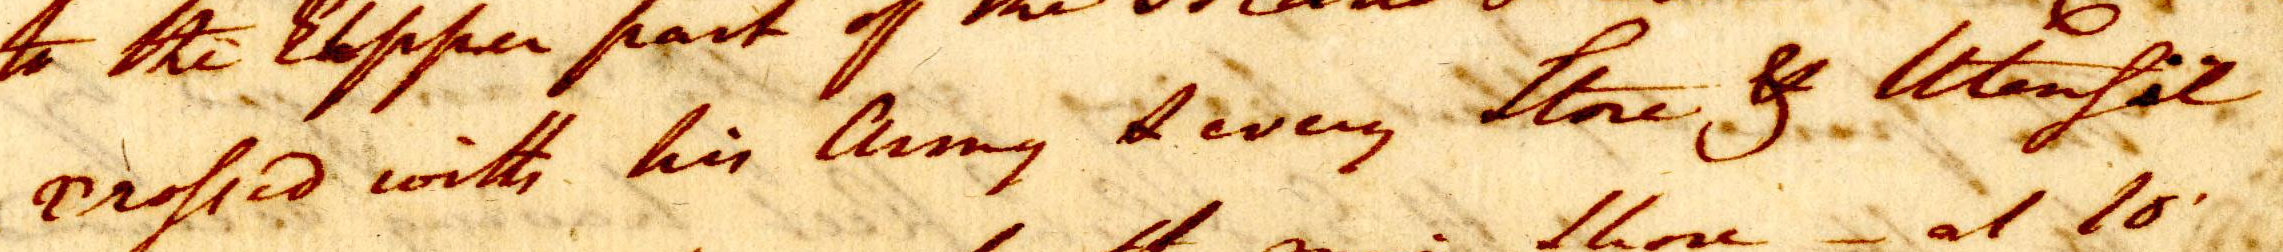crossed with his Army & every store & Utensil
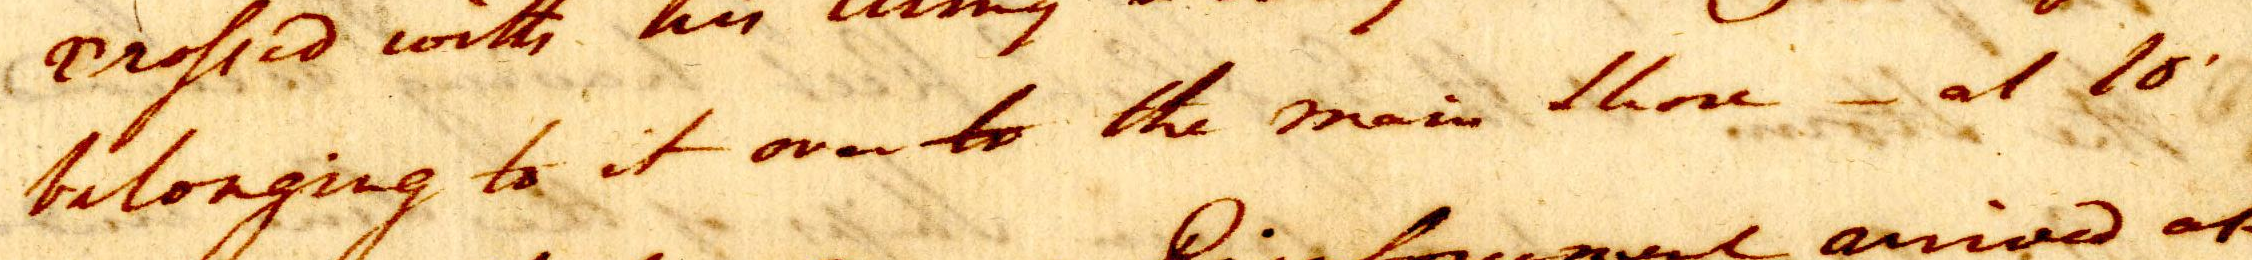belonging to it over to the main Shore. at 10
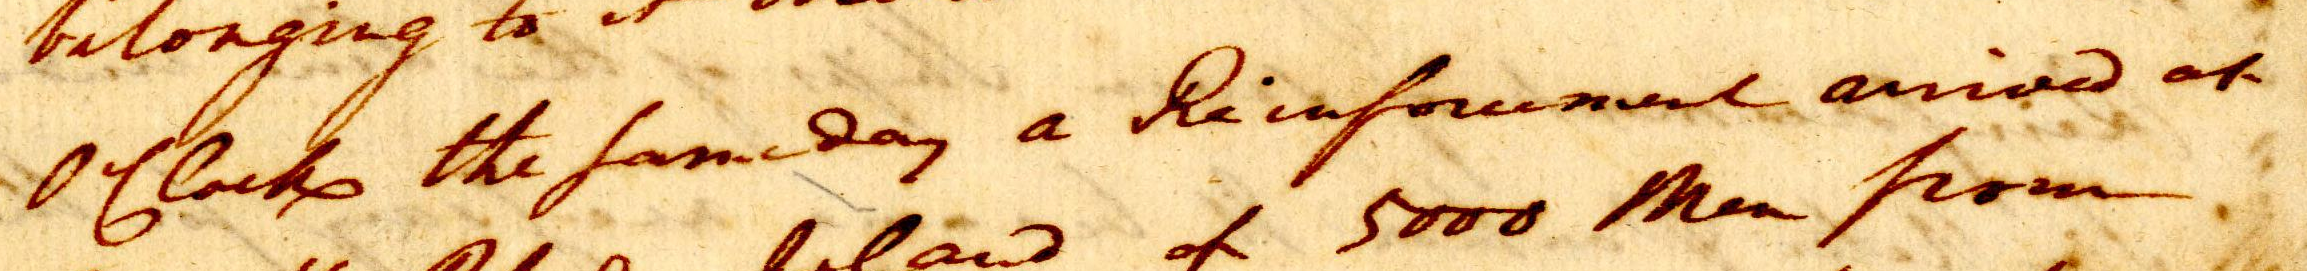O Clock the same day a Reinforciment arrived at
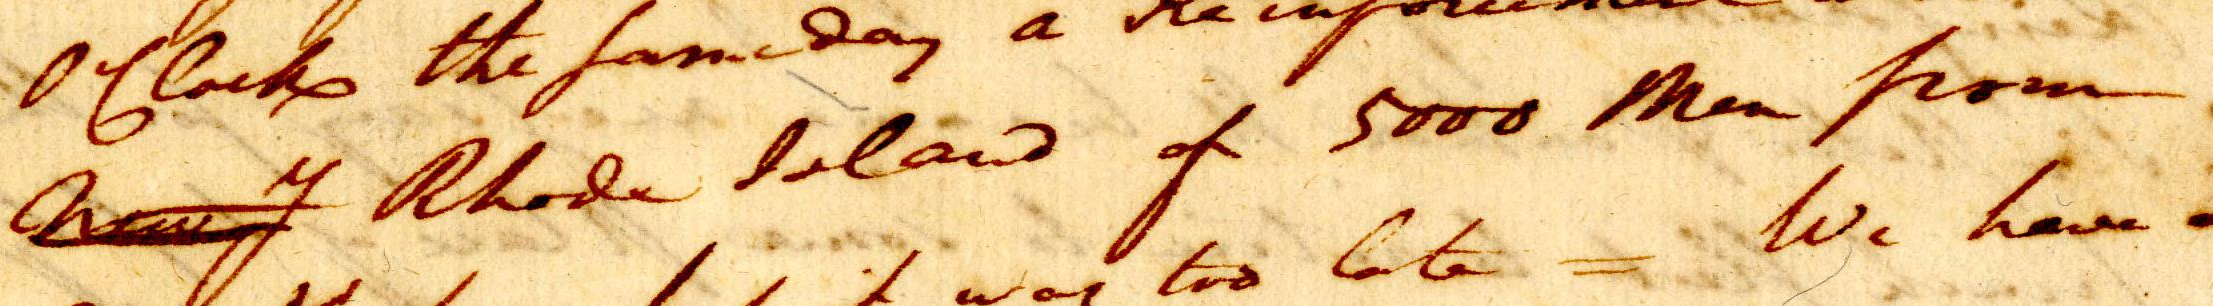New Y Rhode Island of 5000 Men from
